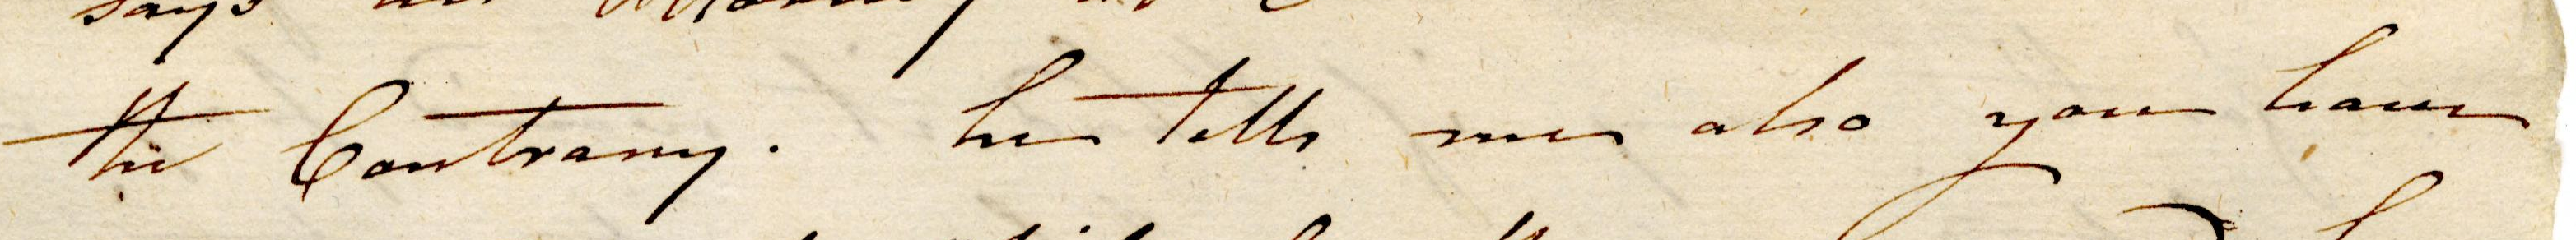the Contrary. he tells me also your have
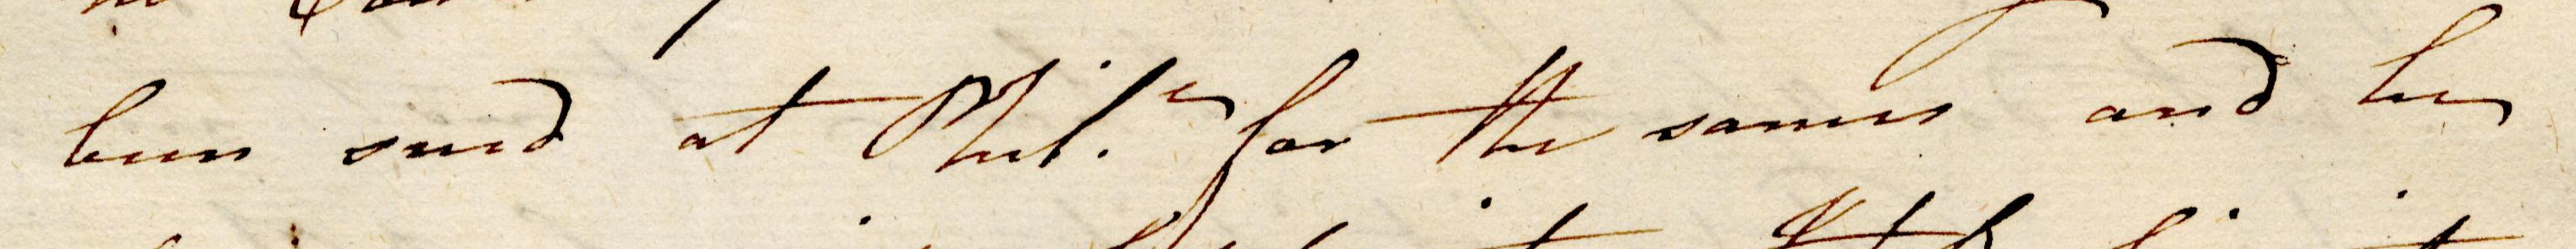been sued at Phia^a. for the same and he
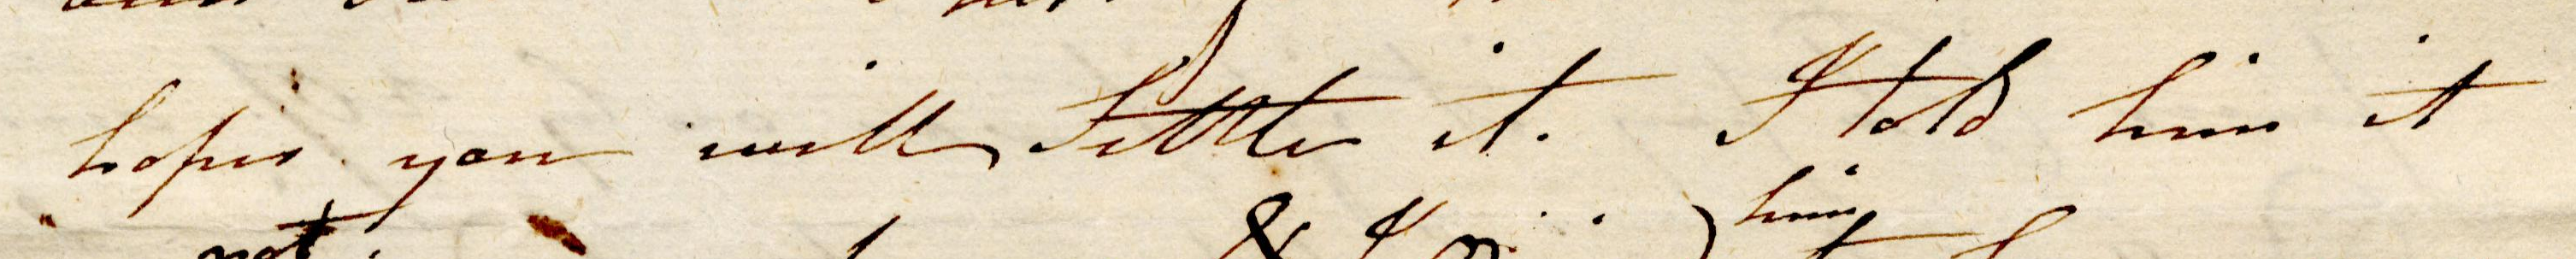hopes you will Settle it. I told him it
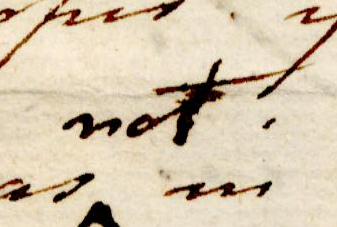not
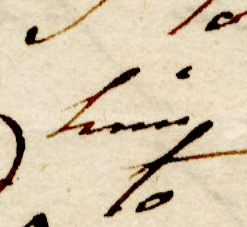him
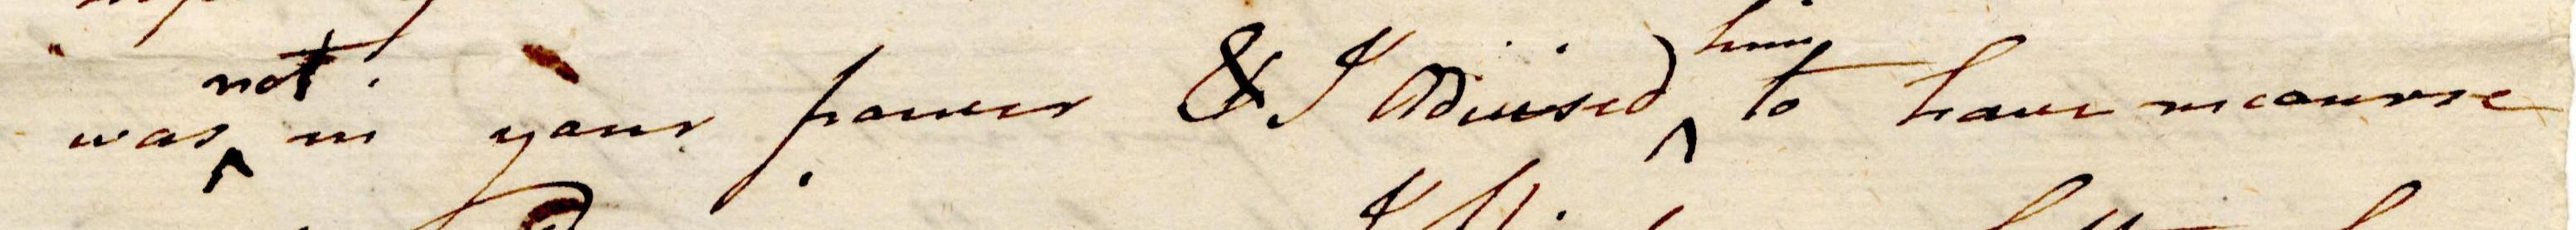was ^ in your power & I advised ^ to have recourse
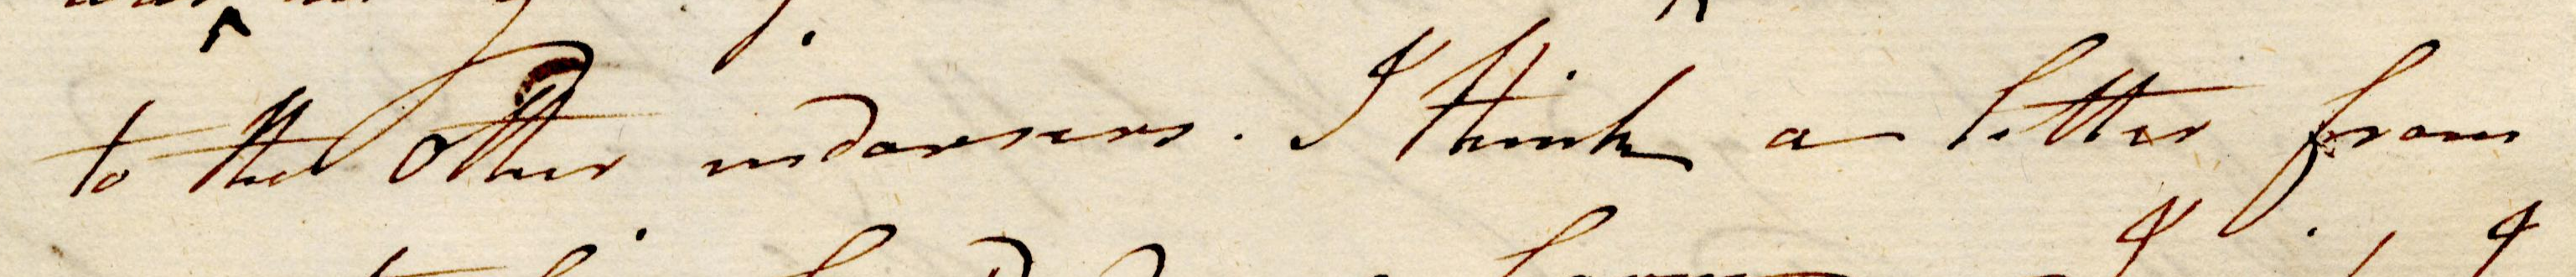to the other indorsers. I think a letter from
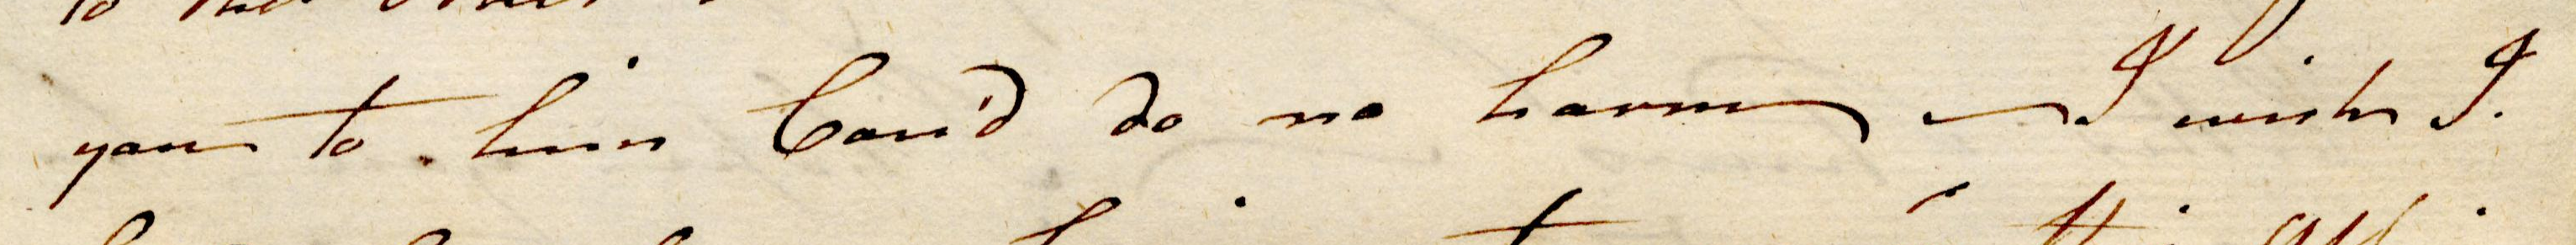you to him Cou'd do no harm- I wish I
